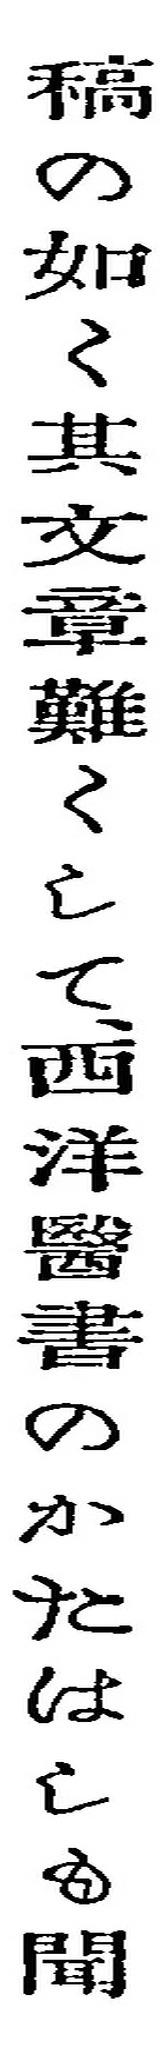稿の如く其文章難しくして、西洋醫書のかたはしも聞
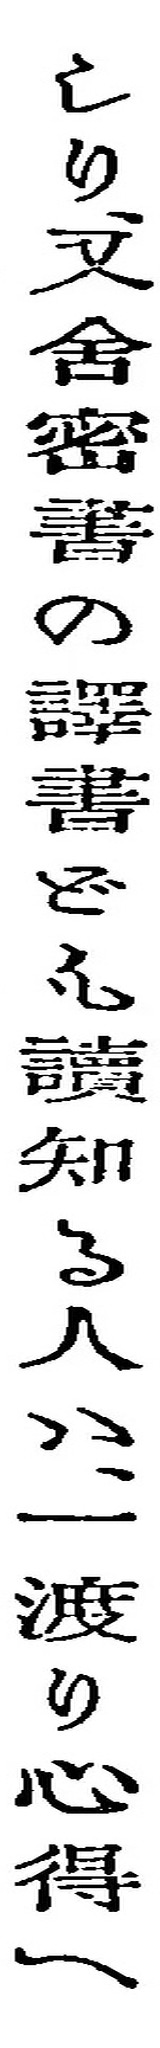しり、又舎密書の譯書ども讀知る人は、一渡り心得へ
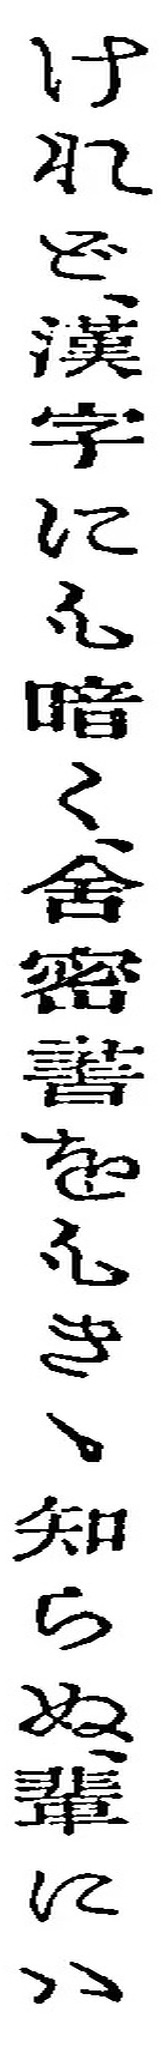けれど、漢字にも暗く、舎密書をもきゝ知らぬ、輩には
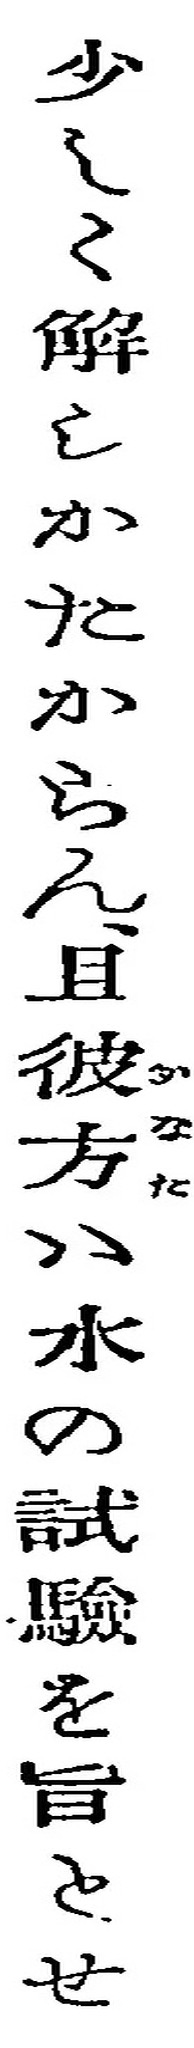少しく解しかたからん、且彼方は水の試験を旨とせ
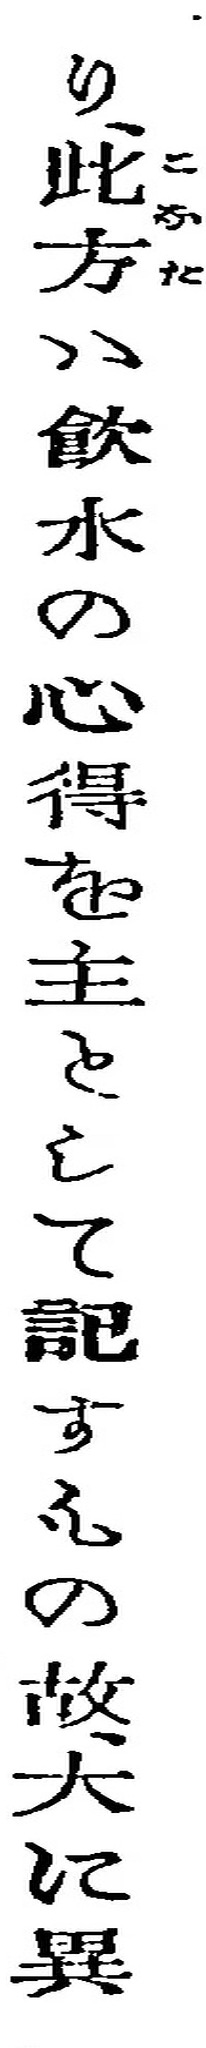り、此方は飲水の心得を主として記すもの故、大に異
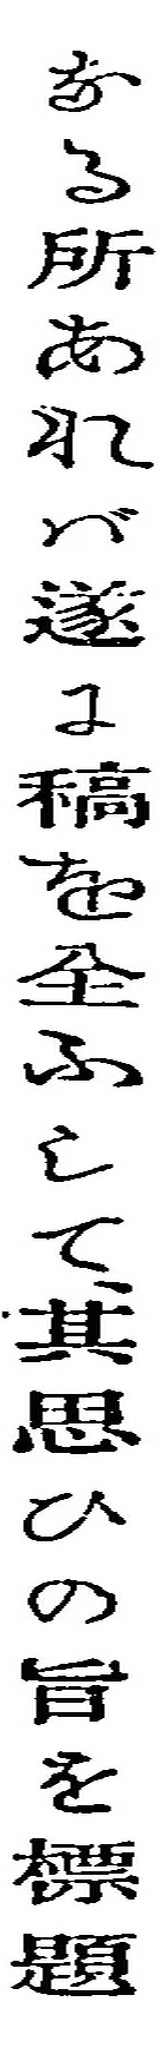なる所あれば遂に稿を全ふして、其思ひの旨を標題
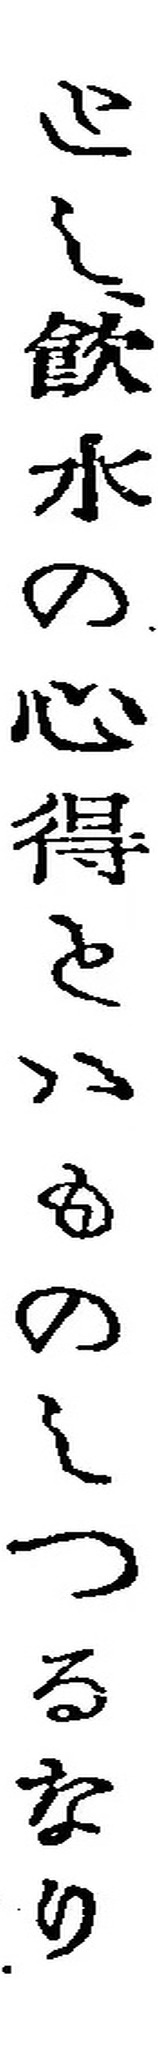とし、飲水の心得とはものしつるなり

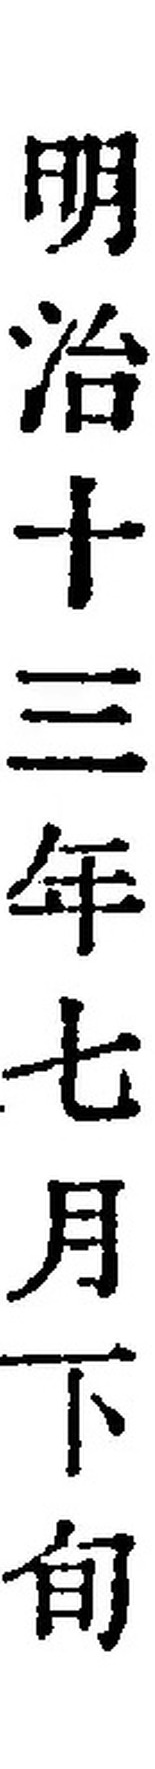明治十三年七月下旬
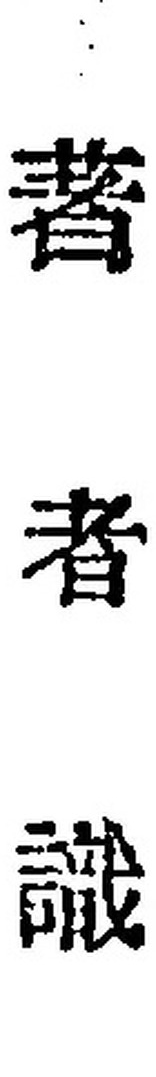著者織
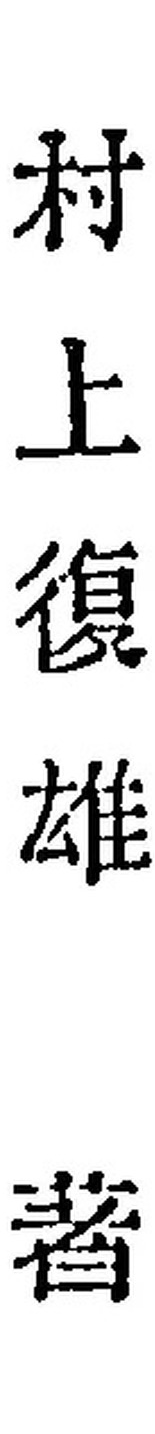村上復雄著
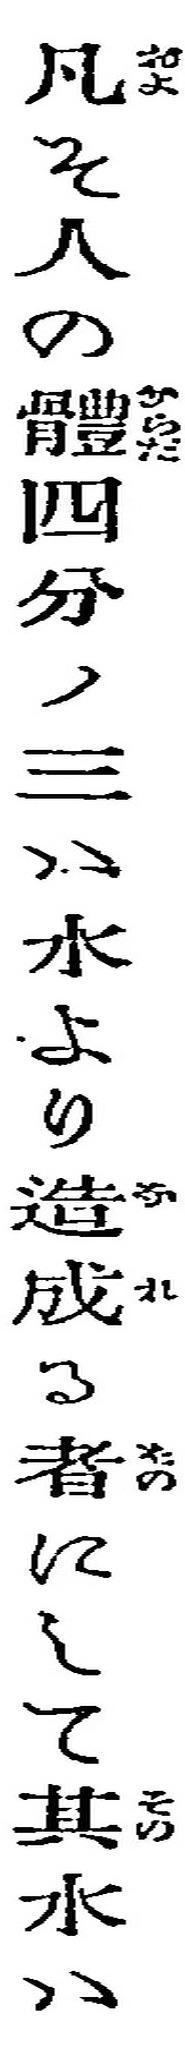凡そ人の體四分の三は水より造成る者にして其水は
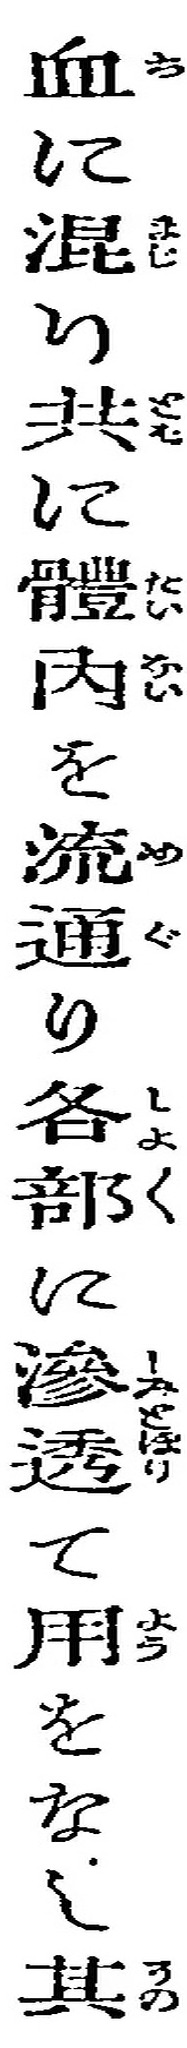血に混り共に體内を流通り各部に滲透て用をなし其
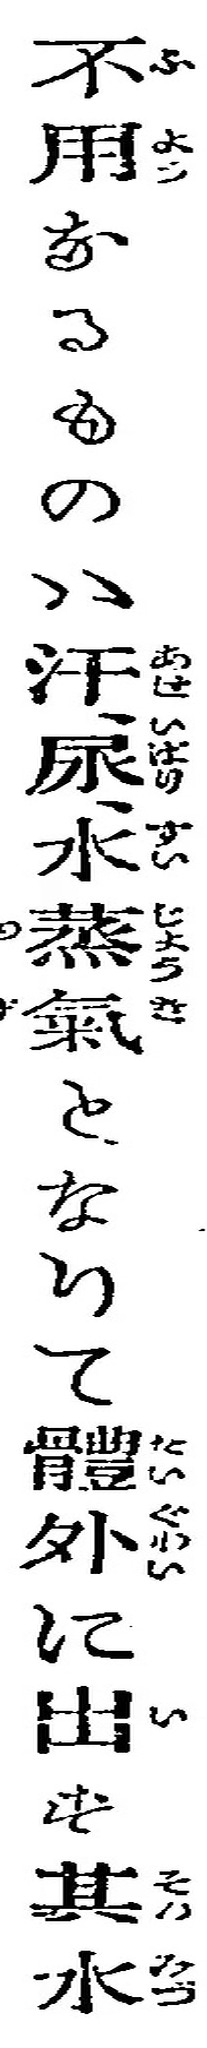不用なるものは汗、尿、水蒸気となりて體外に出ず其水
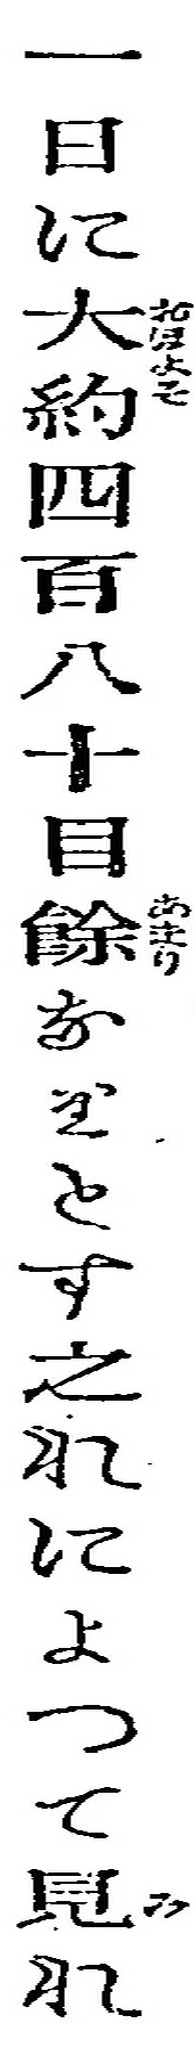一日に大約四百八十目餘なりとす之れによつて見れ
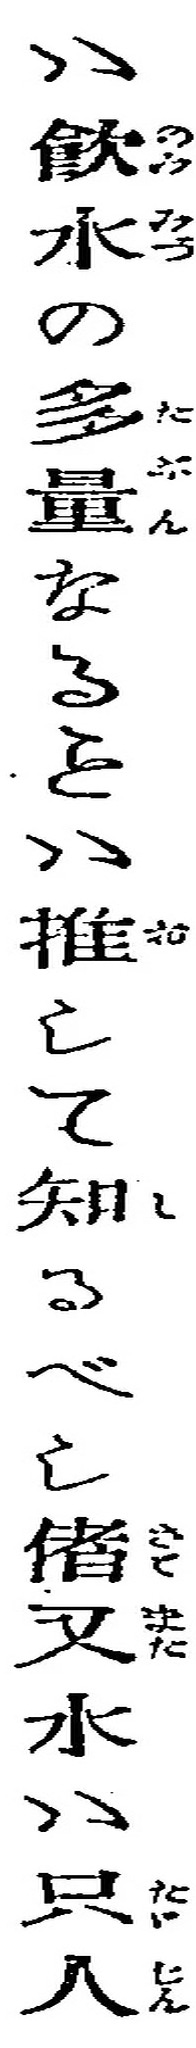は飲水の多量なることは推して知るべし偖又水は只人
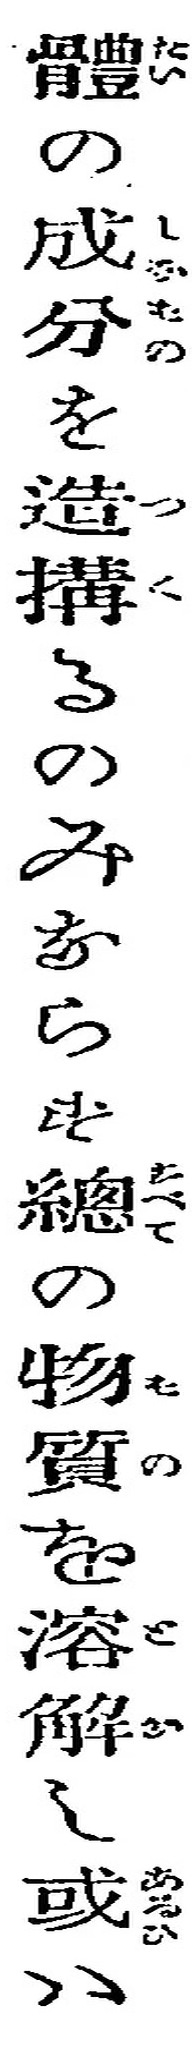體の成分を造搆るのみならず総の物質を溶解し或は
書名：飲水の心得 : 伝染病の予防
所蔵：国立国会図書館 National Diet Library, JAPAN
